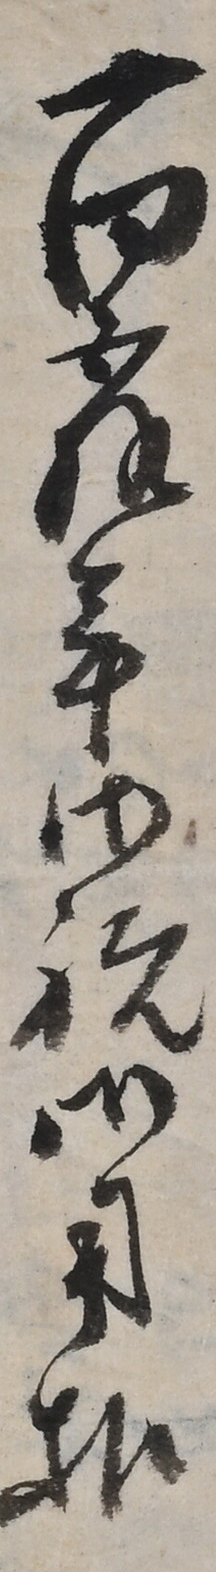百五拾年御祝御用控
